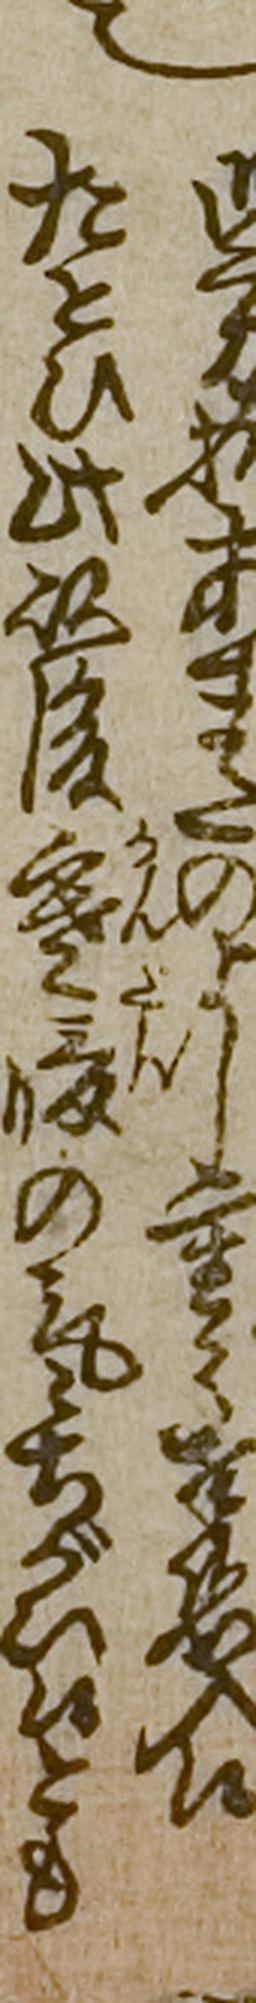たとひ此以後寒暖の気ちがい候とも
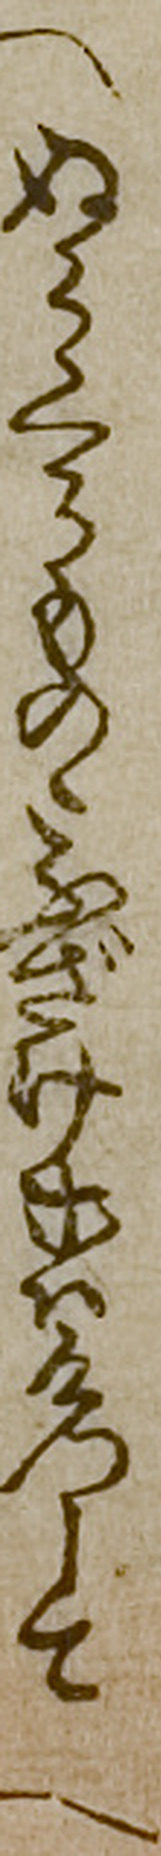ぬらくらものゝふざけ等はけつして
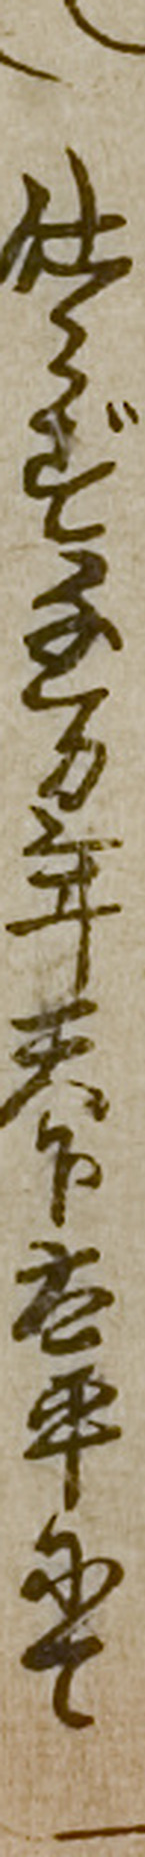仕らず千万年天下太平にて
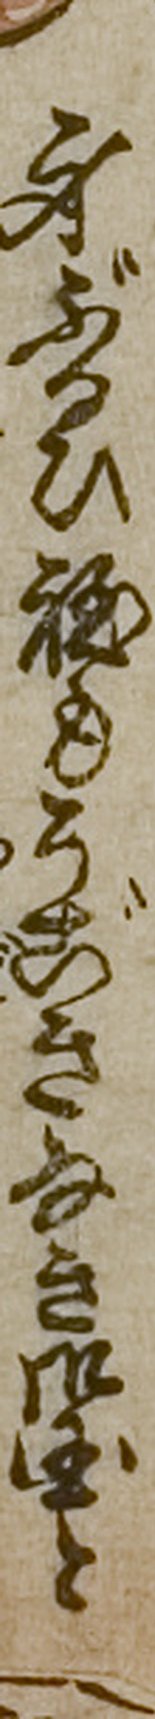身ぶるひ程もうごきなき御国と
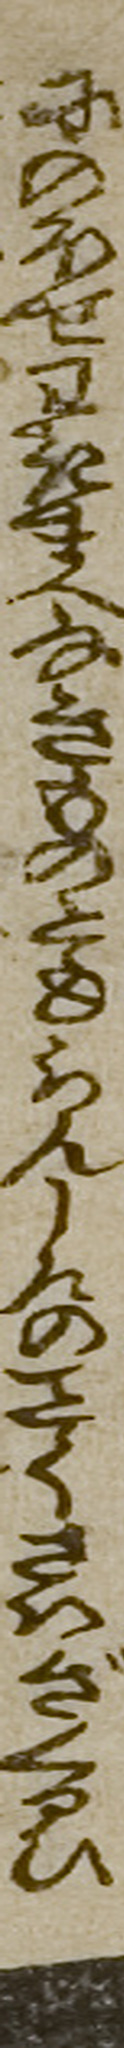にのほせわきまへなきものともらんしんのことくさはぎくるひ
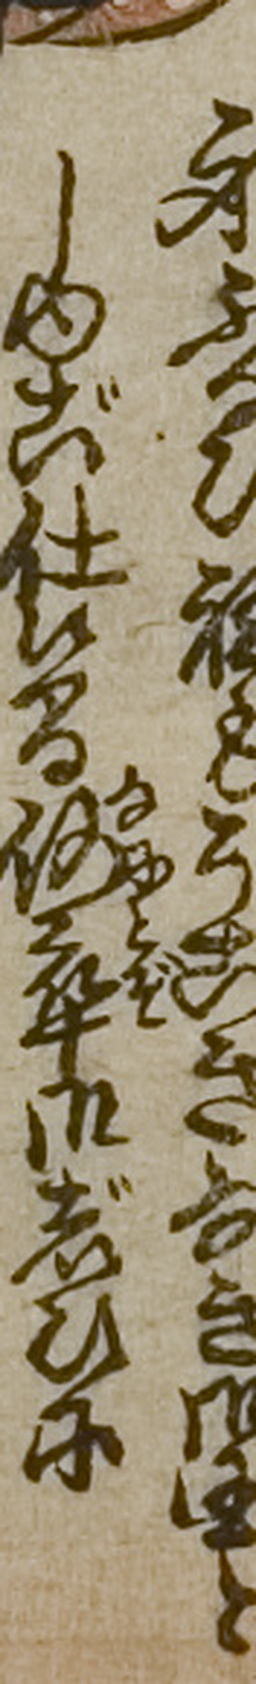しゆご仕候間何卒御じひに
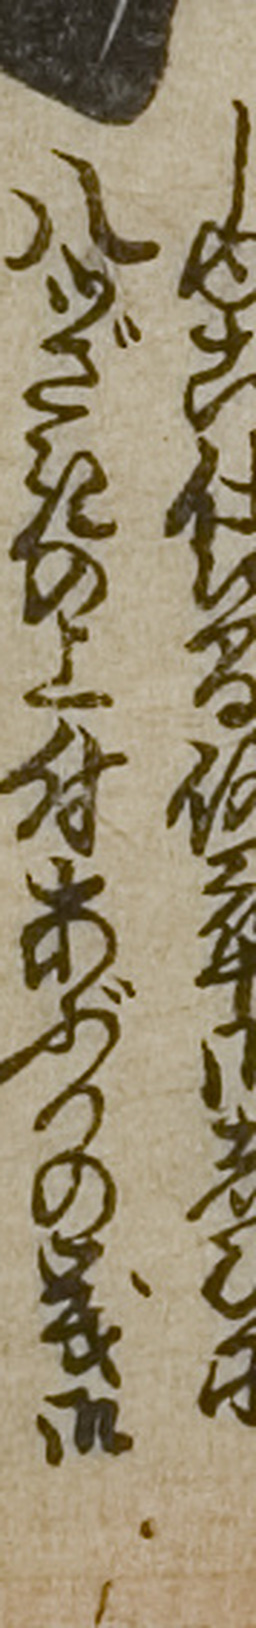八つざきの上付あぶりの義御
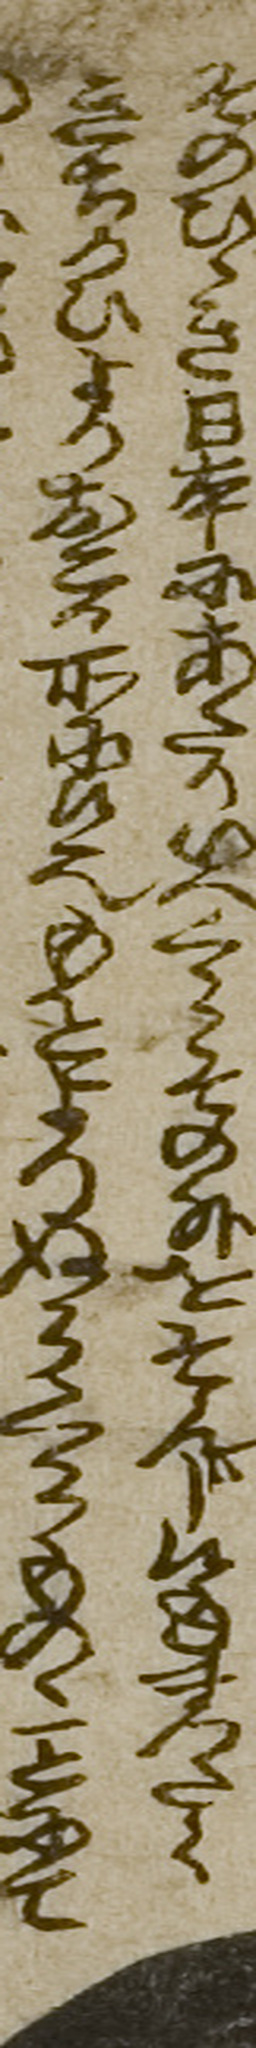きちかひよりおこる所に候也もとよりぬらくらものゝことにて
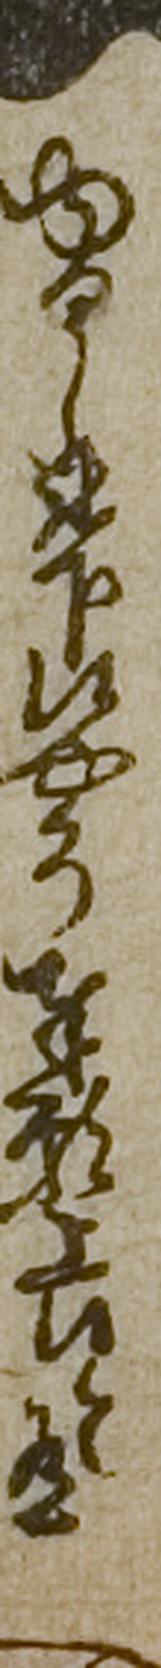ゆるし被下候やう奉願上候と有
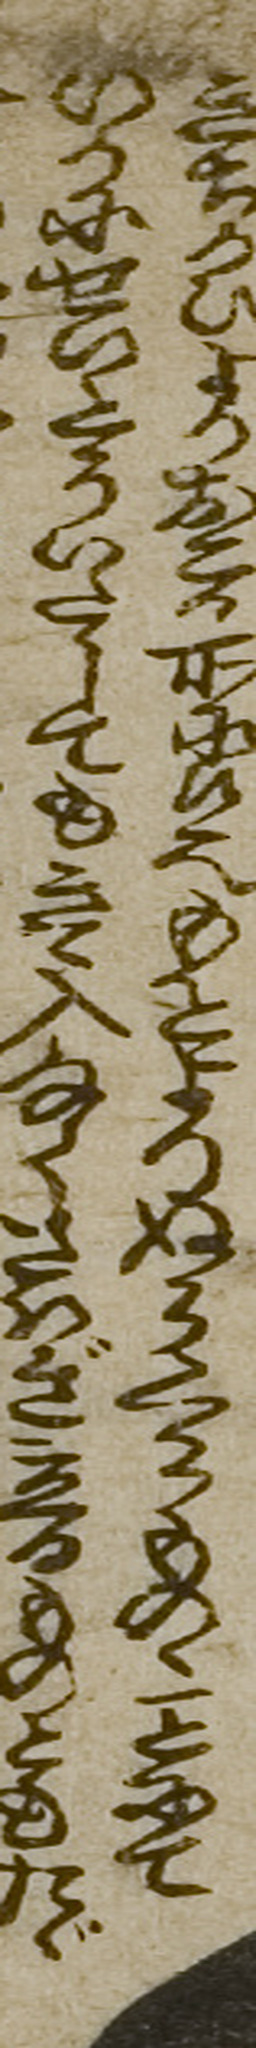いかにせいとういたしてもきゝ入なくさわぎ立るものともたゞ
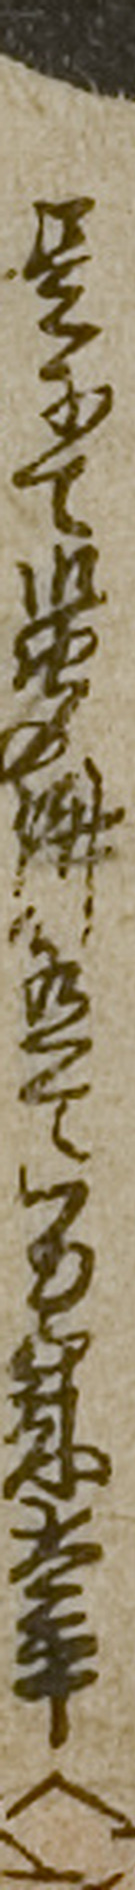是にて御聞済有て万歳太平
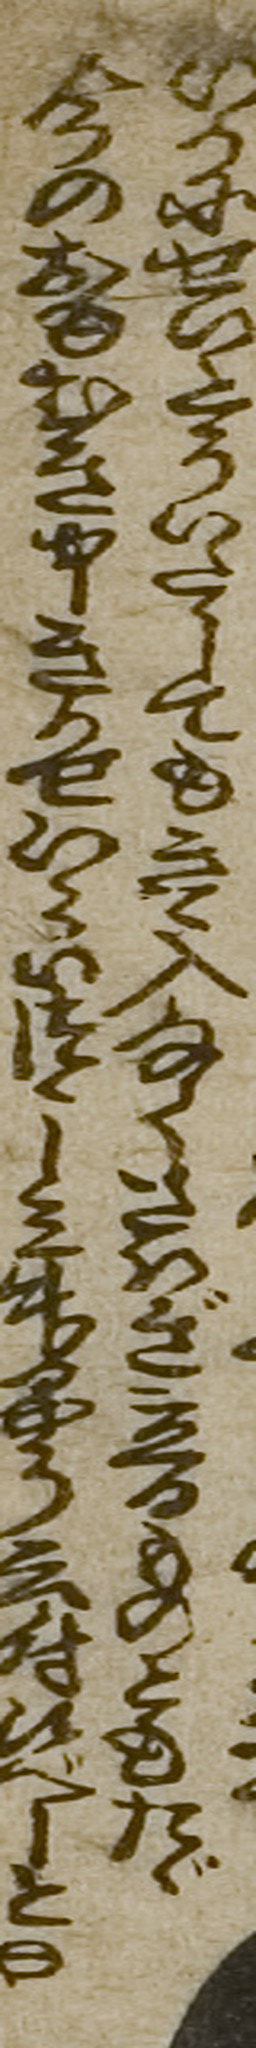今のおもむき申きかせいらいつゝしみ升るやう云付候べしと
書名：鹿島大神宮託曰
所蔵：東京大学総合図書館 General Library in the University of Tokyo, JAPAN
